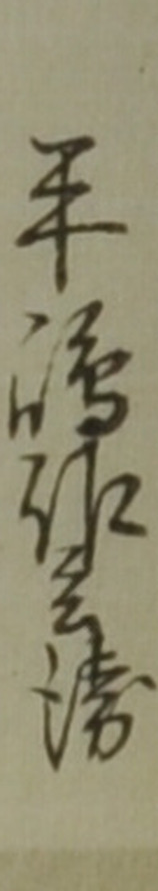平嶋佐兵衛

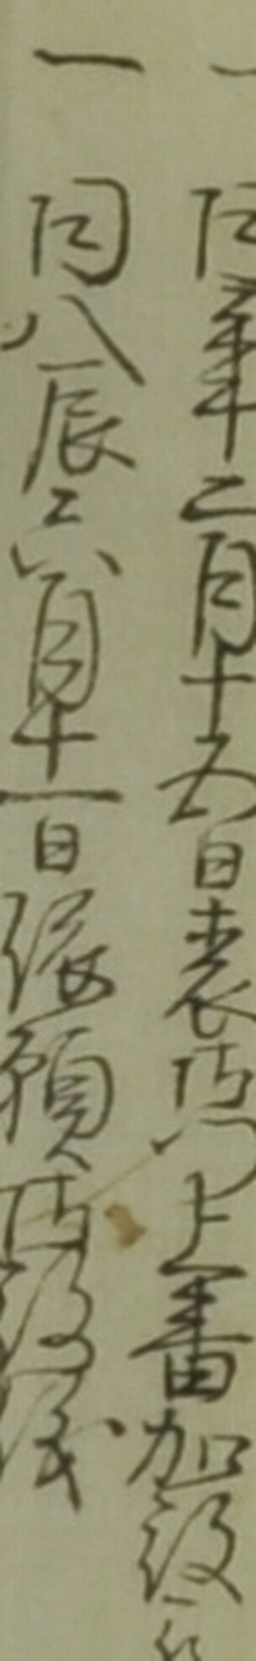一同八辰六月十一日依願御役儀
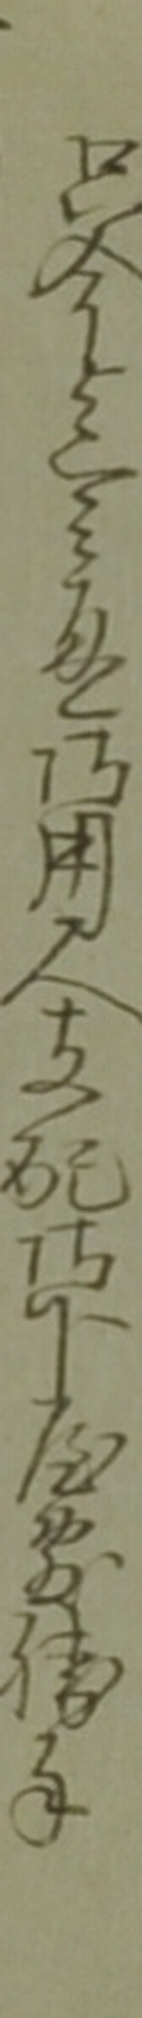只今迄之通御用人支配御下屋敷勝手
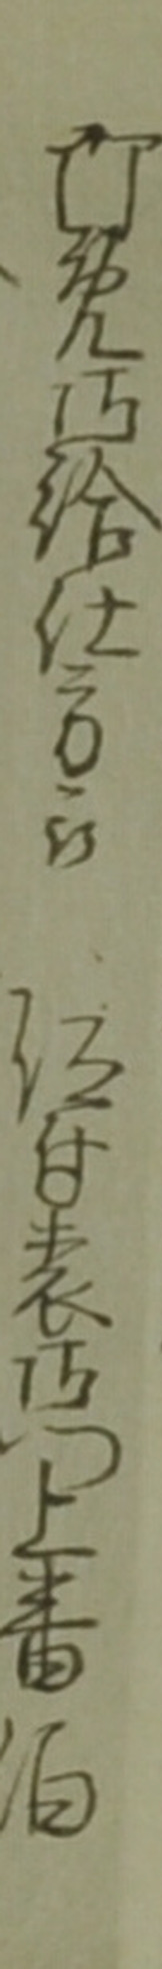御免御給仕方被仰付表御門上番泊
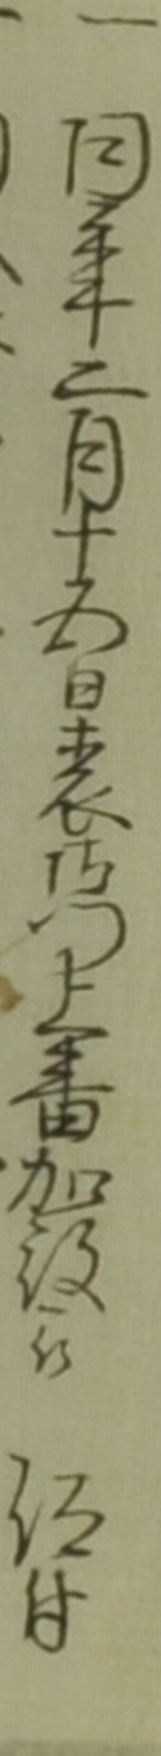一同年二月十五日表御門上番加役被仰付
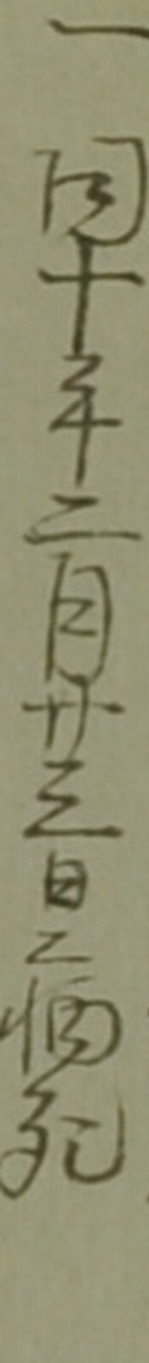一同十午二月廿三日病死
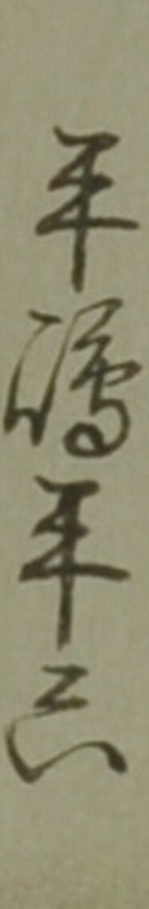平嶋平六
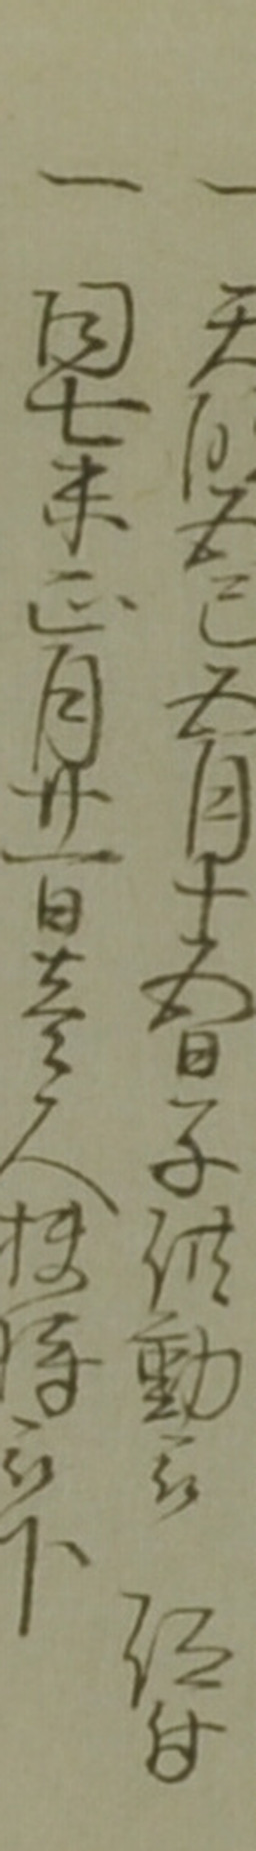一同七未正月廿一日壱人扶持御増被下
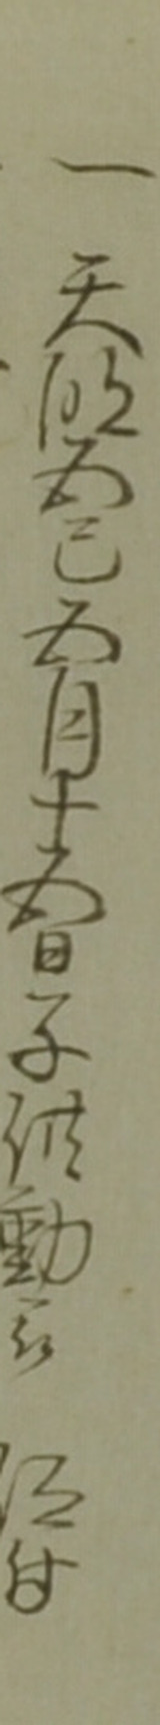一天明五巳五月十五日子供勤被仰付
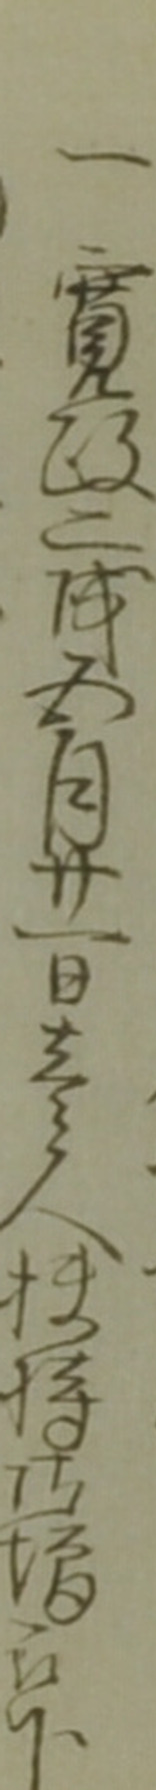一寛政二戌五月廿一日壱人扶持御増被下
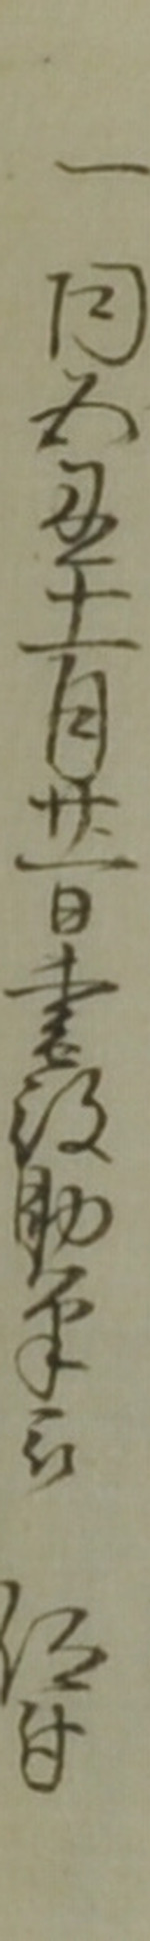一同五丑十一月廿一日書役助筆被仰付
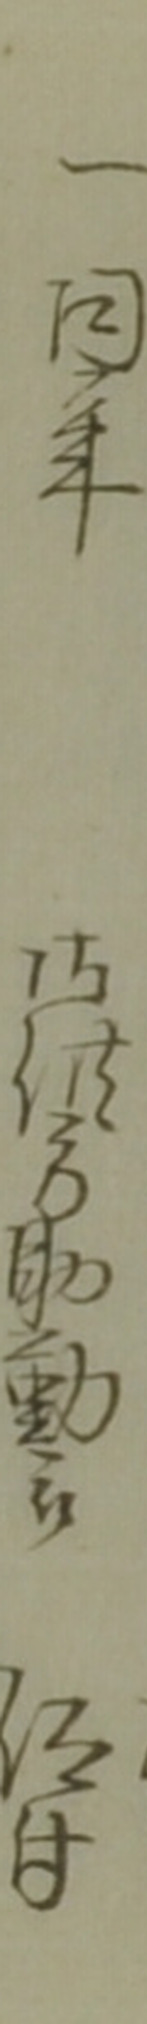一同年御供方助勤被仰付
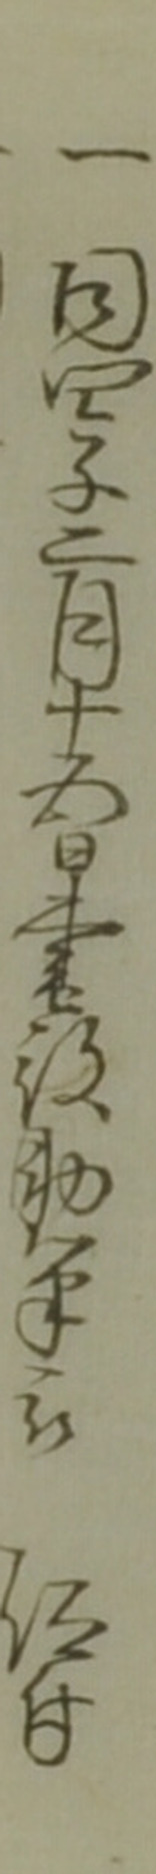一同四二月十五日書役助筆被仰付

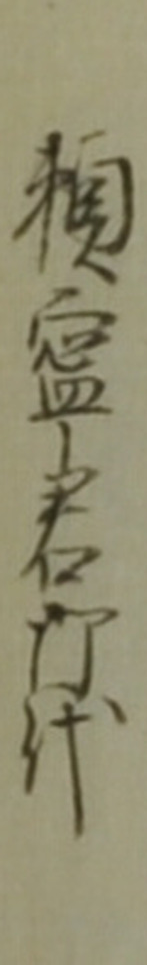頼寧君御代
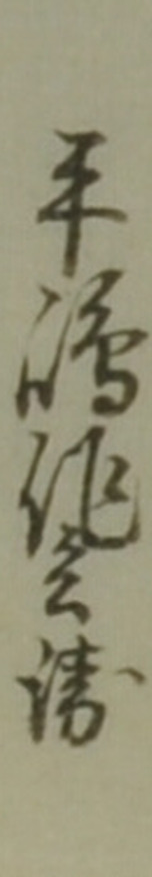平嶋作兵衛
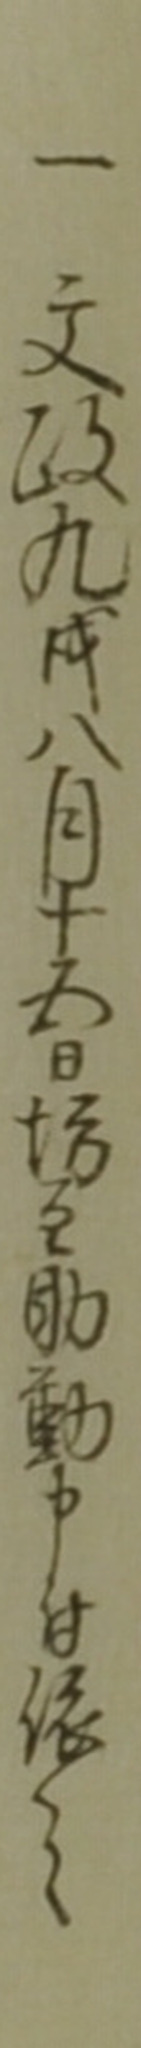一文政九戌八月十五日坊主助勤申付依之
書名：無足諸士勤仕録（三）
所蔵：伊那市立高遠町図書館・合同会社AMANE
